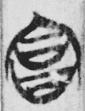合（答）
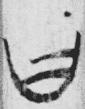曰
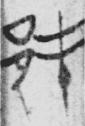邦
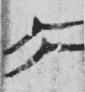大
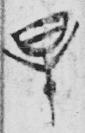旱
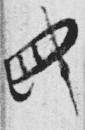母（無）
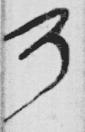乃
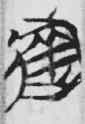○（失）
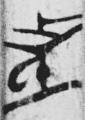者（諸）
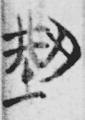型（刑）
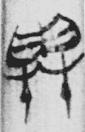與
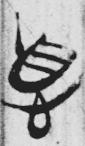惪（德）
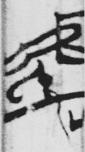○（乎）
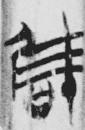唯
